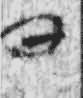日
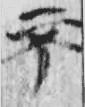不
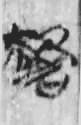○（胡）
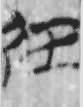弡
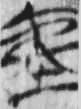○（夷）
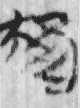○（胡）
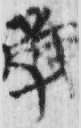○（雘）
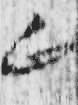㠯
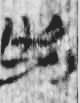○（廷）
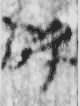阩
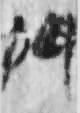門
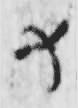又
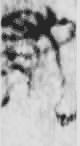敗
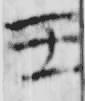王
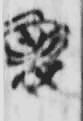婁
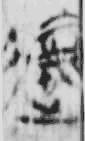逯
